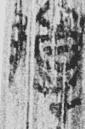○（牆）
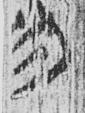勿
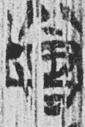增
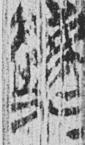灋（廢）
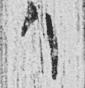人
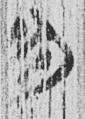勿
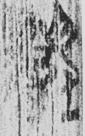○（與）
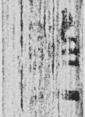皇
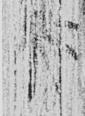天
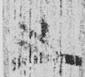之
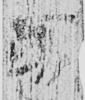所
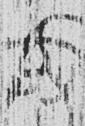弃
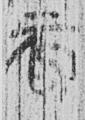而
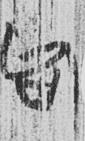句（后）
